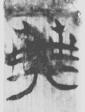典
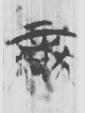獄
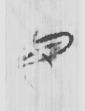母
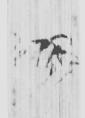{尾少}
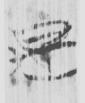是
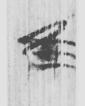隹
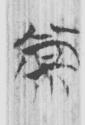常
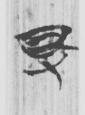𠭁
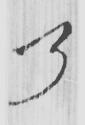乃
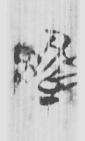降
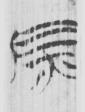庶
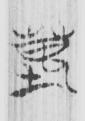{艸土田儿}
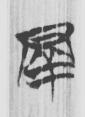羣
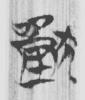{獸土}
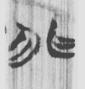非
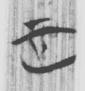正
